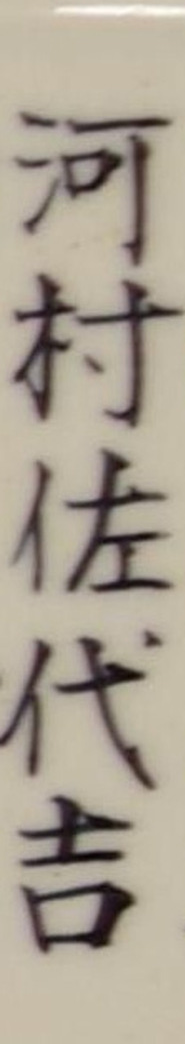河村佐代吉
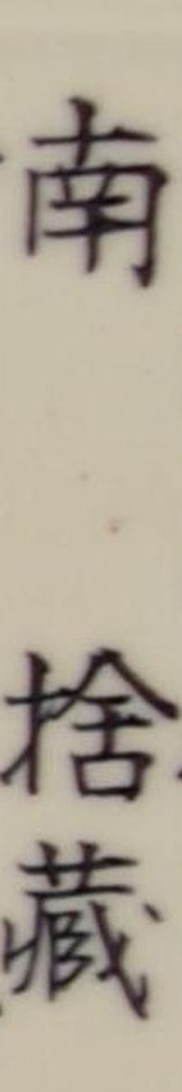南捨蔵
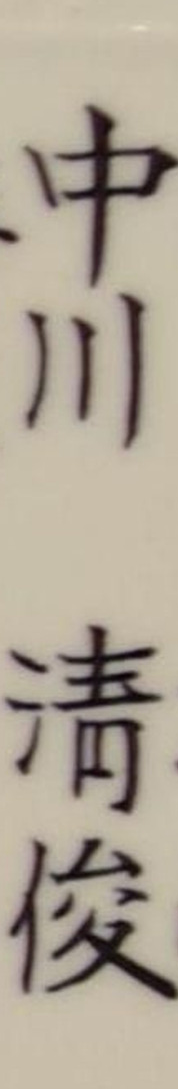中川清俊
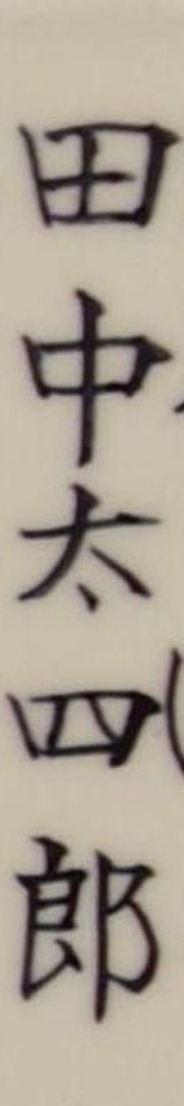田中太四郎
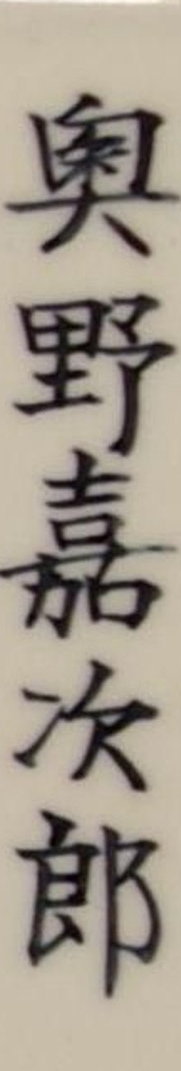奥野嘉次郎
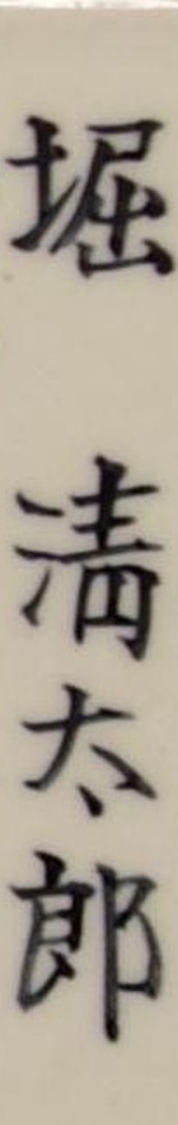堀清太郎
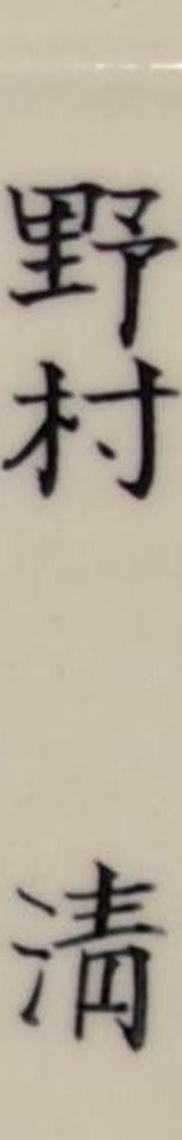野村清
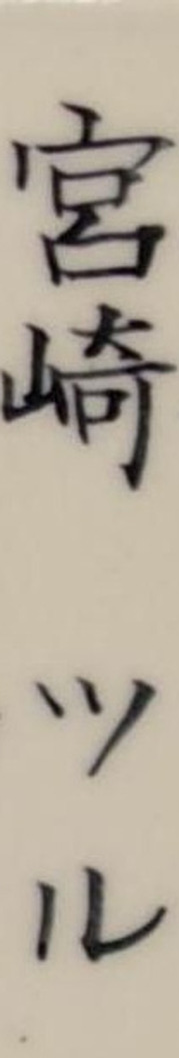宮崎ツル
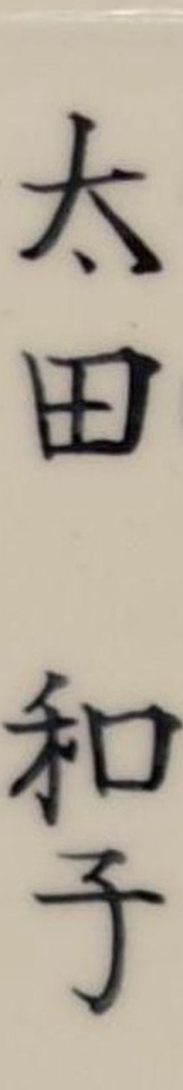太田和子
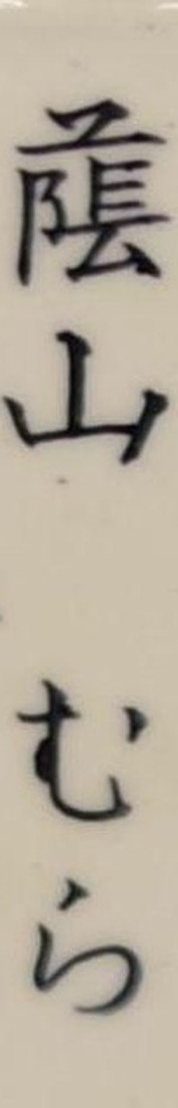蔭山むら
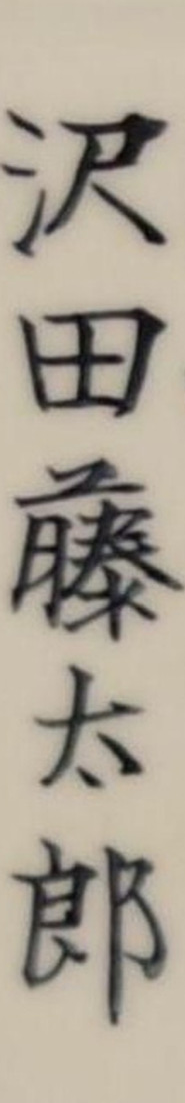沢田藤太郎
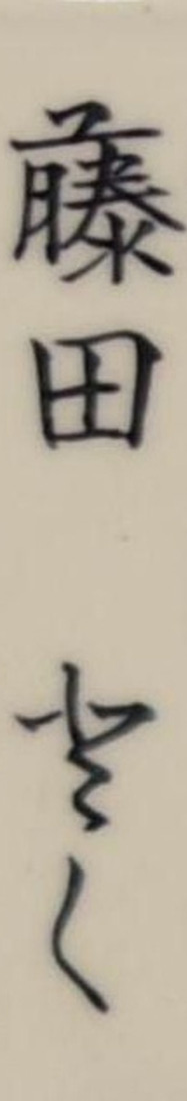藤田とく
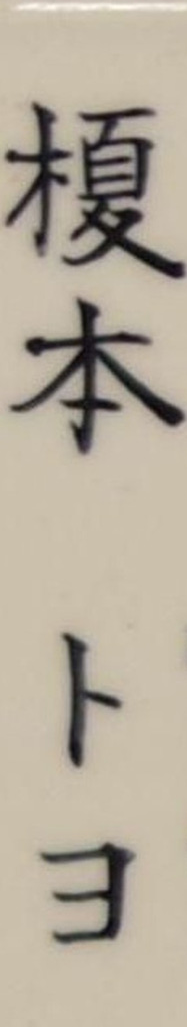榎本トヨ
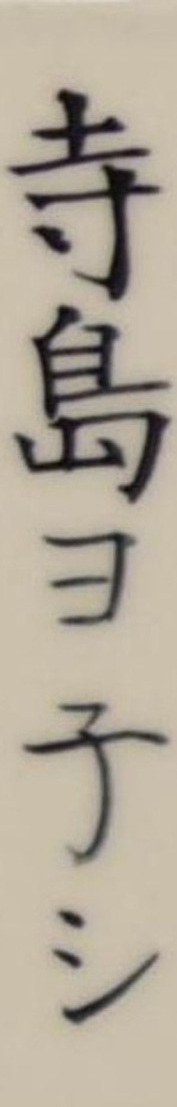寺島ヨネシ
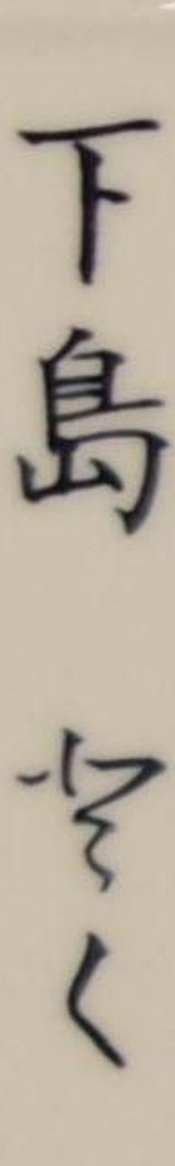下島とく
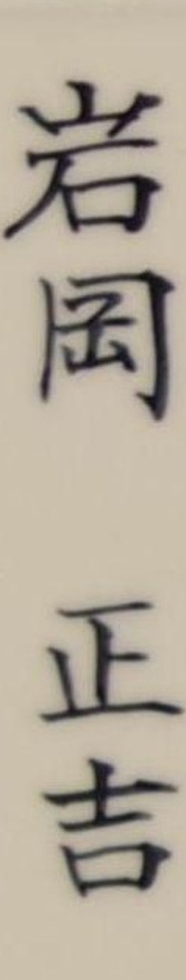岩岡正吉
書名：M~S
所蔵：高野山金剛峯寺
